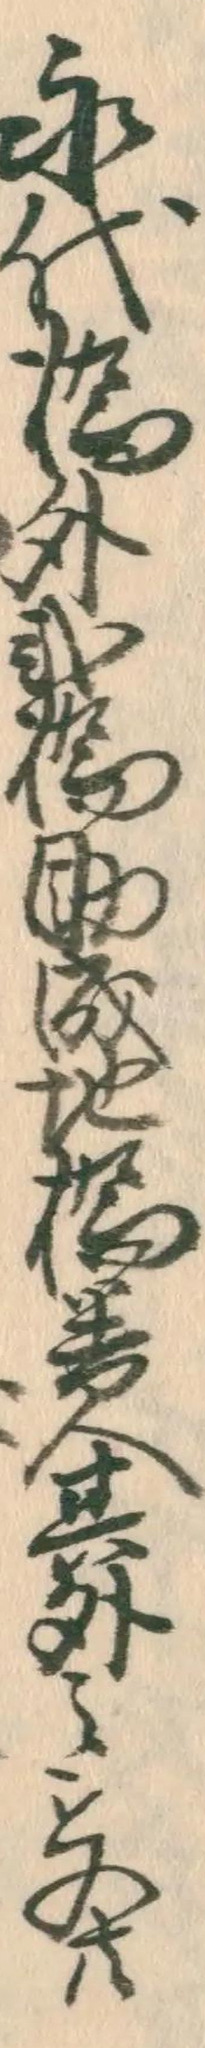永代橋外弐橋助成地橋番人其外之もの共
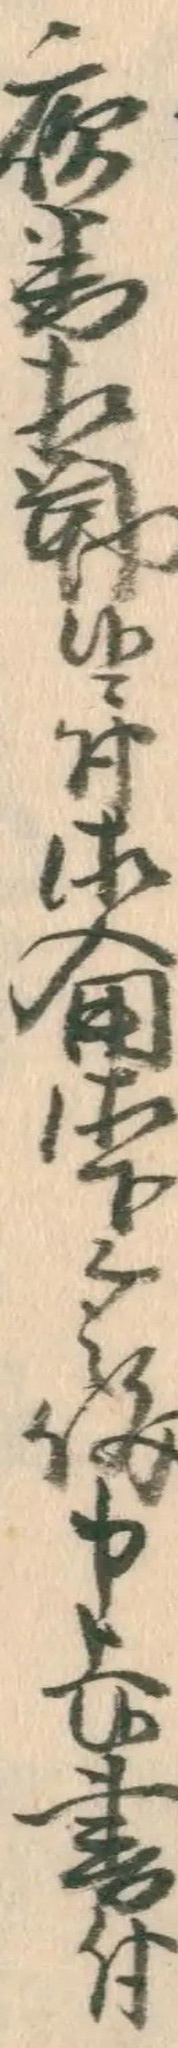夜番相勤候ニ付御入用御下ケ之儀申上候書付
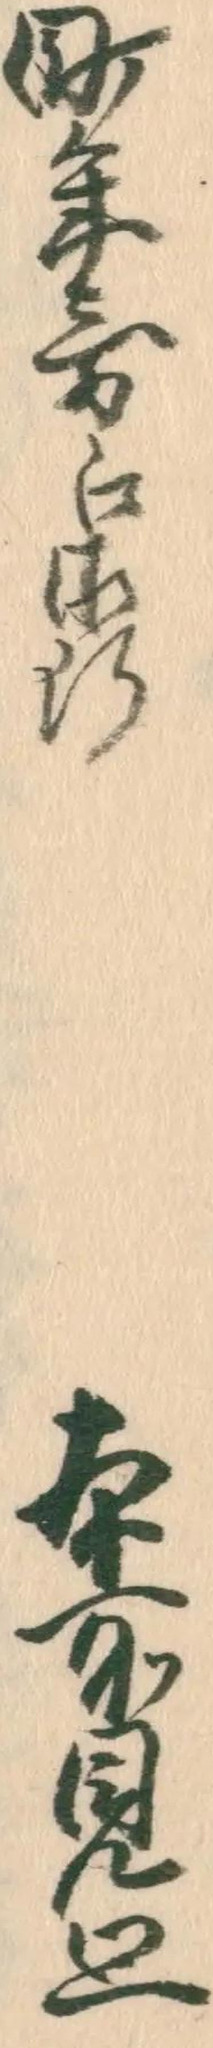町年寄え御断本所見廻
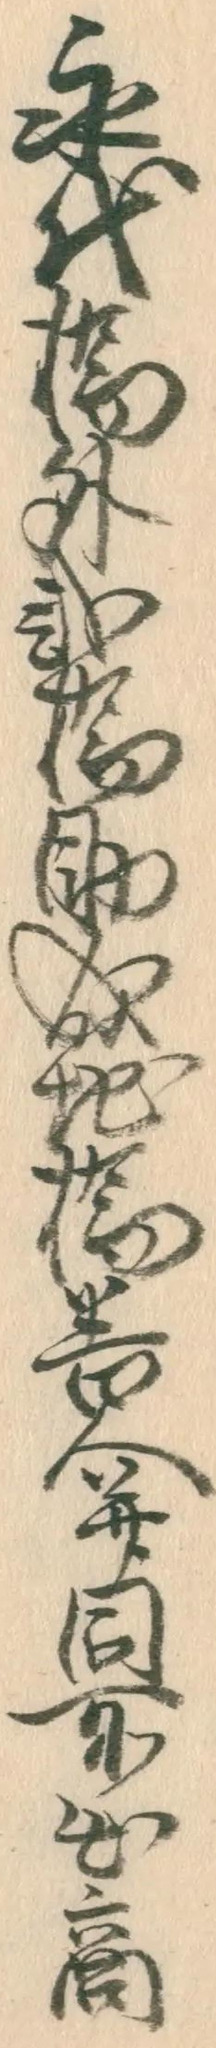永代橋外弐橋助成地橋番人并同所出商
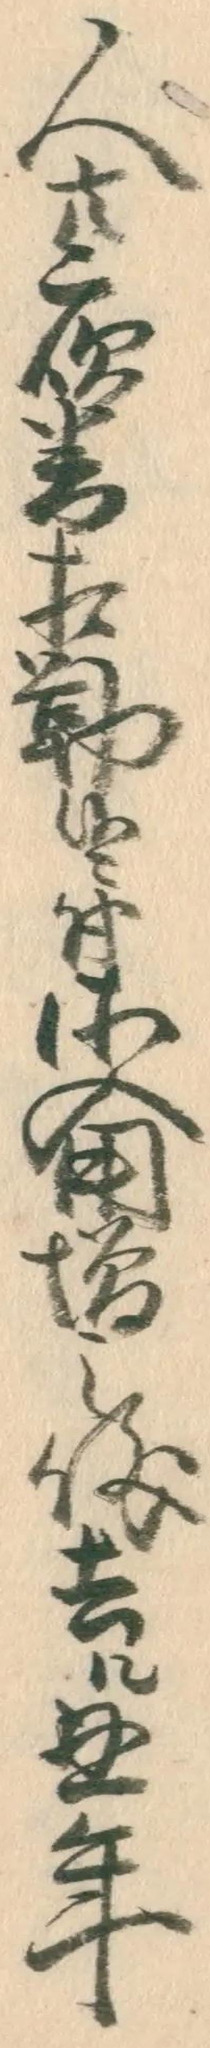人共夜番相勤候ニ付御入用増之儀去ル丑年

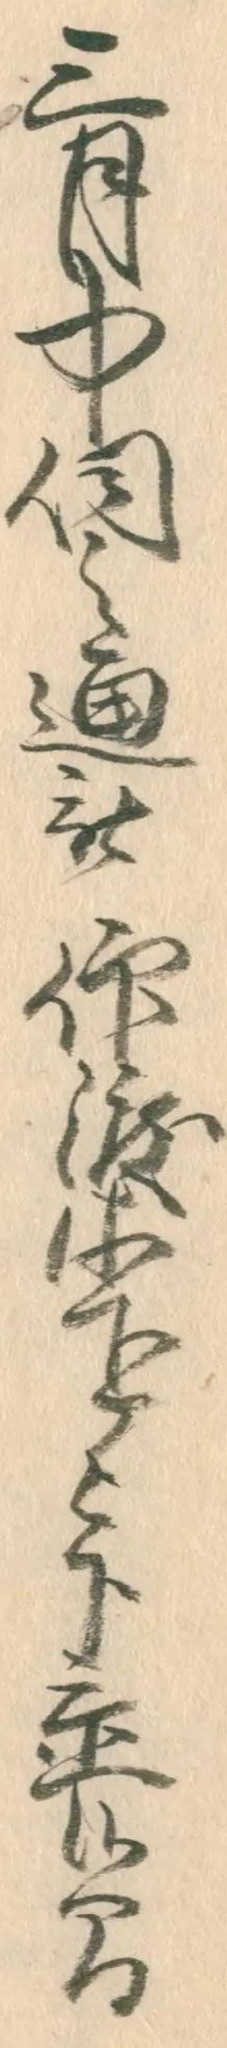三月中伺之通被仰渡御下ケ被下置候間
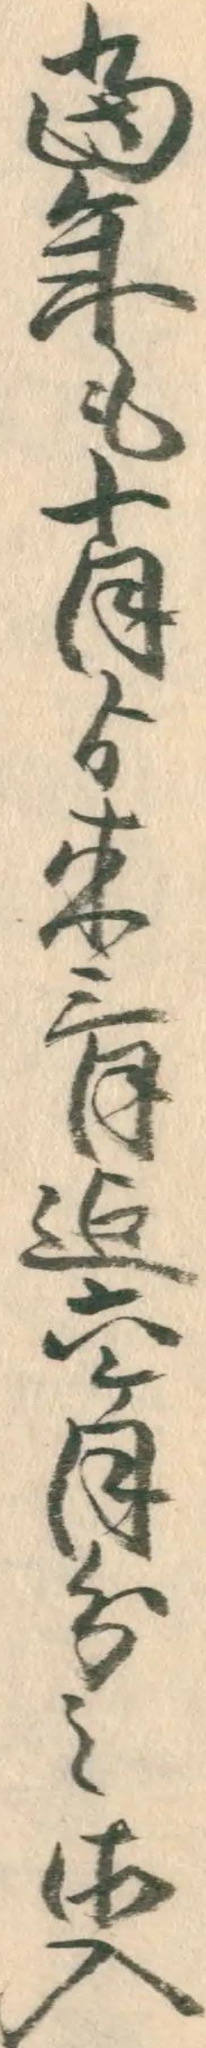当年も十月ゟ来三月迄六ケ月分之御入
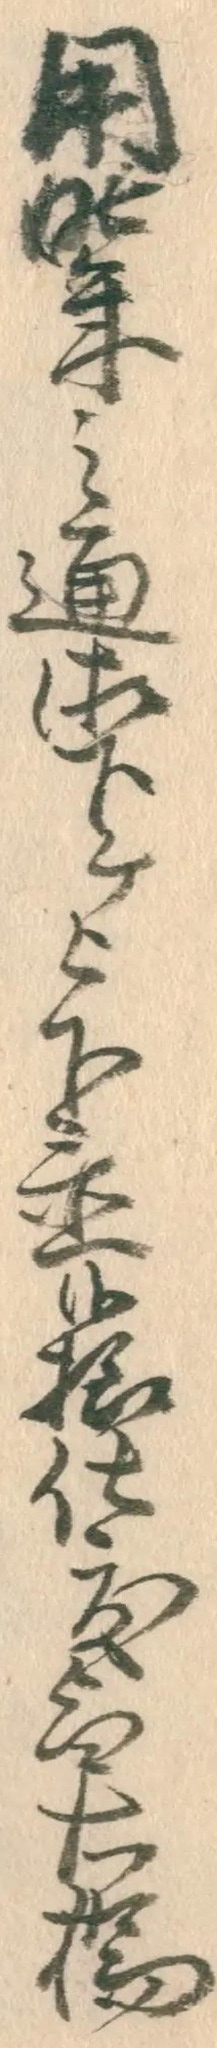用昨年之通御下ケ被下置候様仕度旨右橋
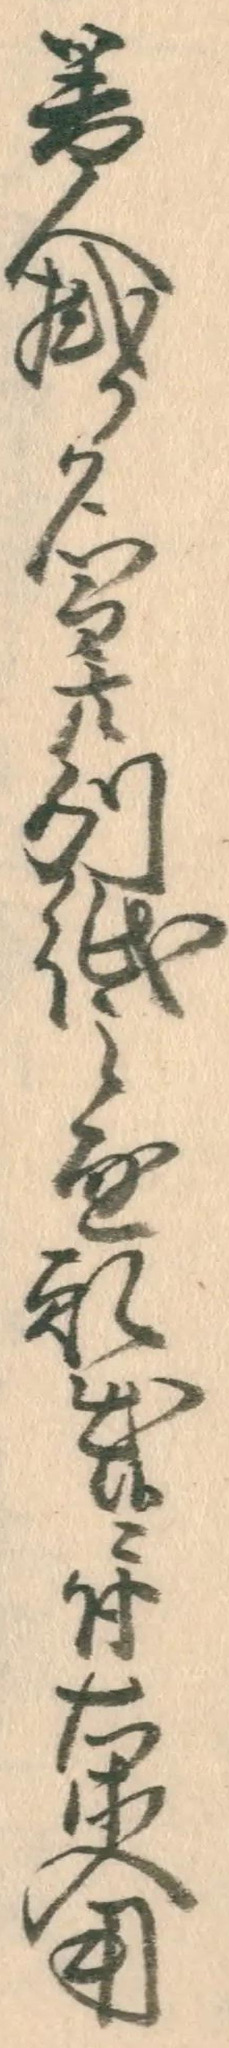番人掛り名主共別紙之通願出候ニ付右御入用
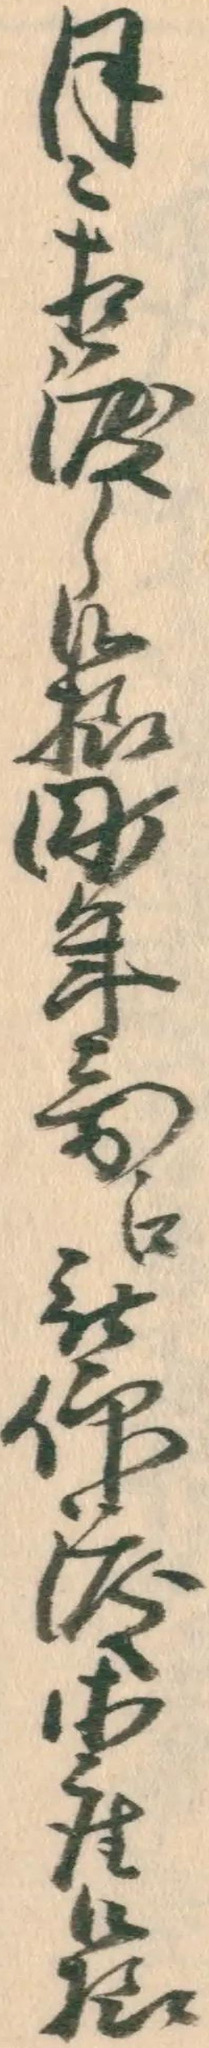月々相渡し候様町年寄え被仰渡御座候様
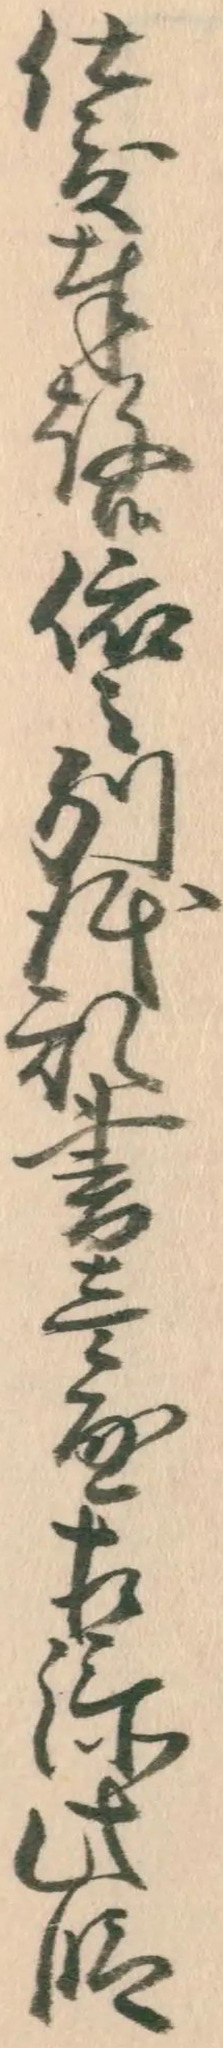仕度奉存候依之別紙願書壱通相添此段
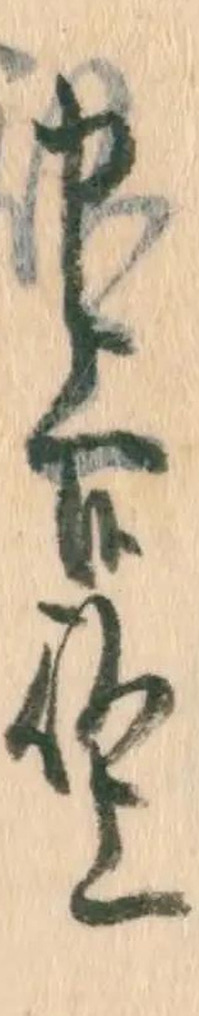申上候以上
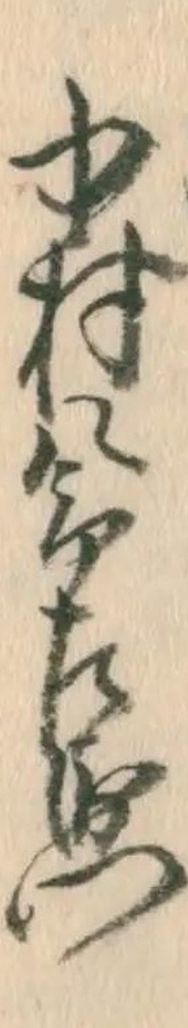中村八郎左衛門

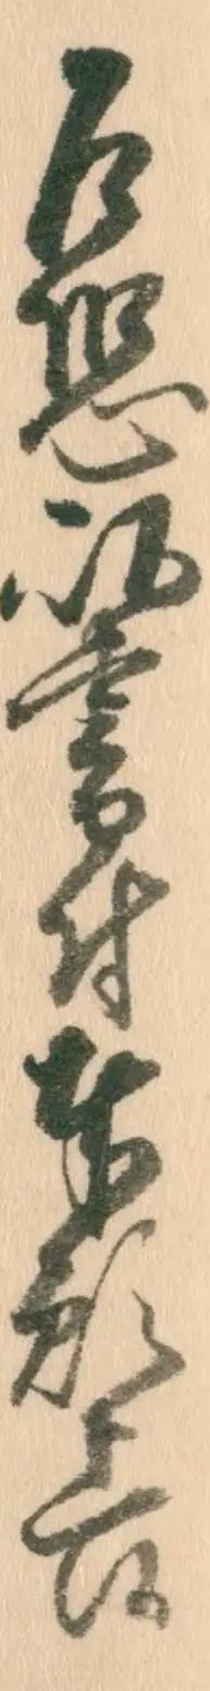乍恐以書付奉願上候
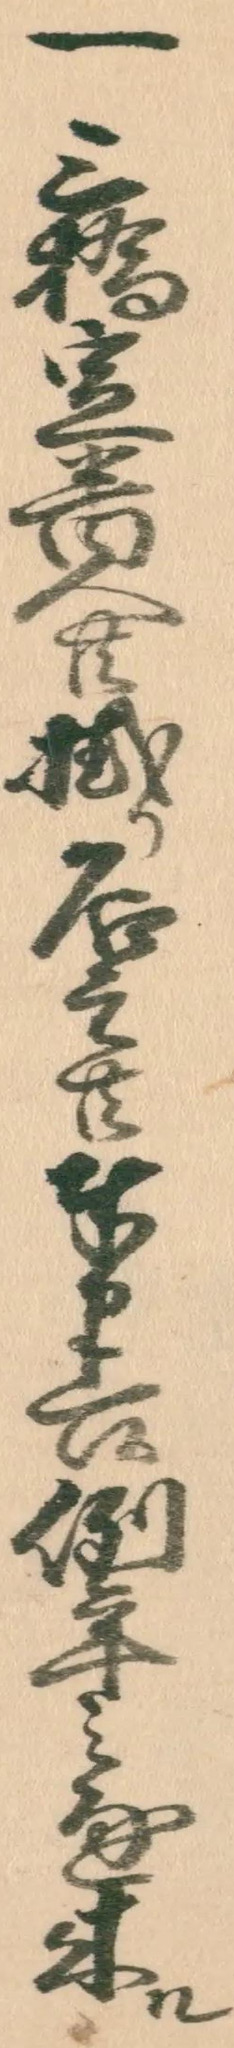一三橋定番人共掛り名主共奉申上候例年之通来ル
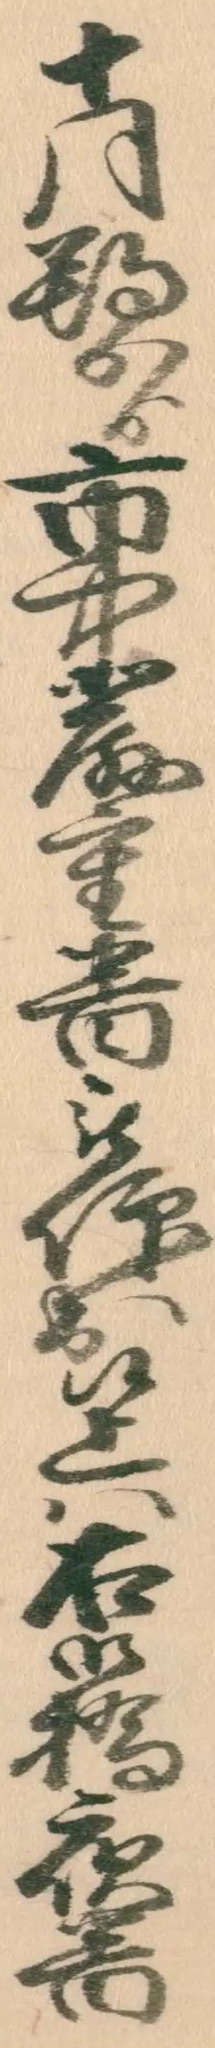十月朔日ゟ市中厳重番被仰出候上ハ右御橋夜番
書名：三橋 17巻. [7] 三橋小破御修復書留　但御奉行御掛リ替地震潰橋番屋　嘉永四亥年より安政二卯年迄　上
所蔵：国立国会図書館 National Diet Library, JAPAN
